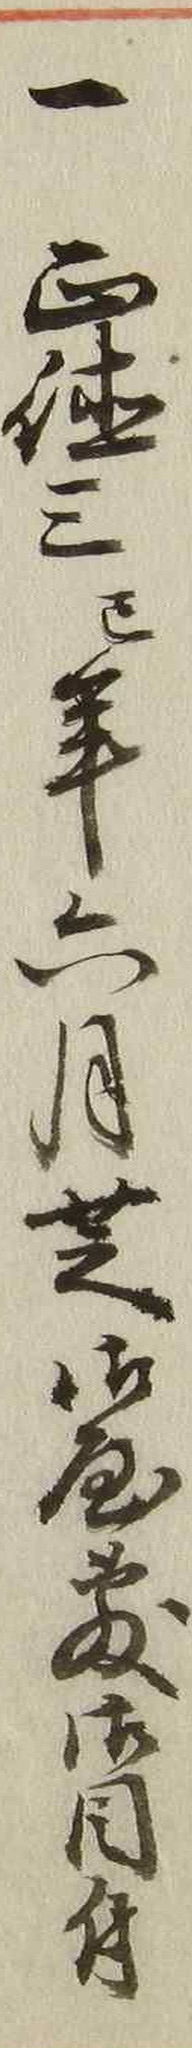一正徳三巳年六月芝御屋敷御目付
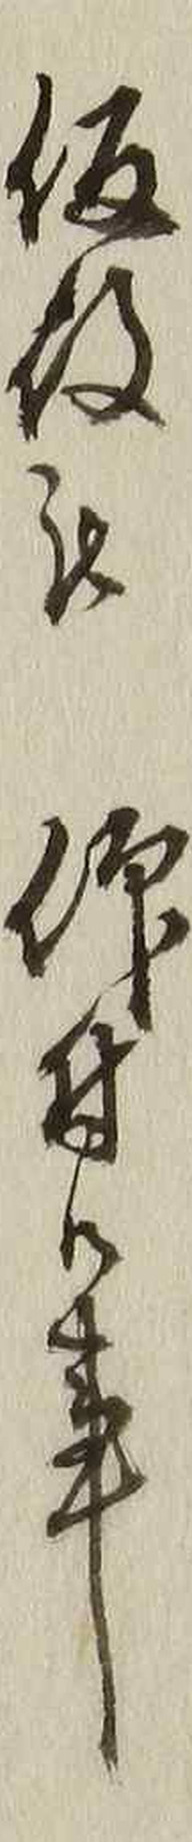仮役被仰付候事
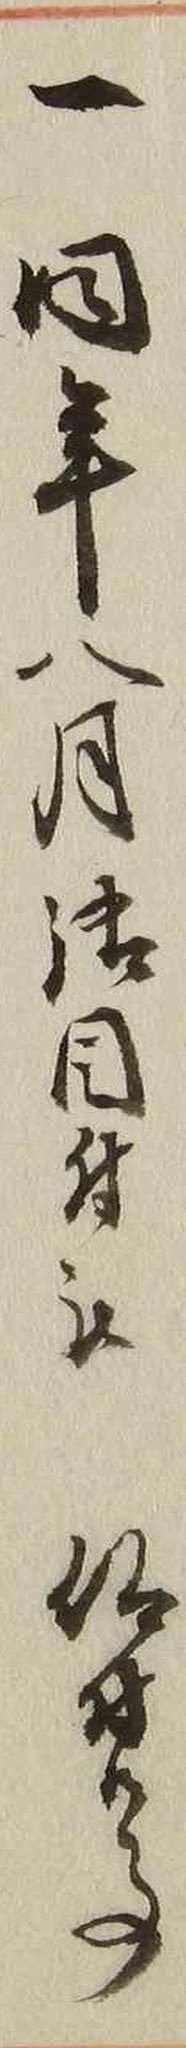一同年八月御目付被仰付候事
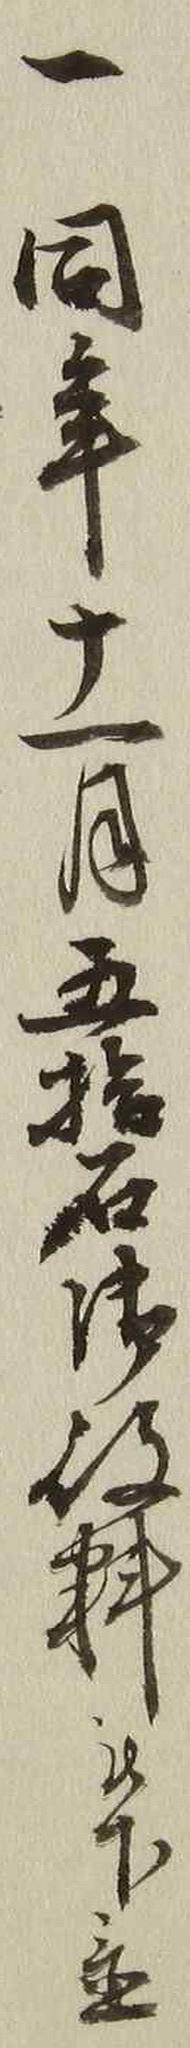一同年十一月五拾石御役料被下置
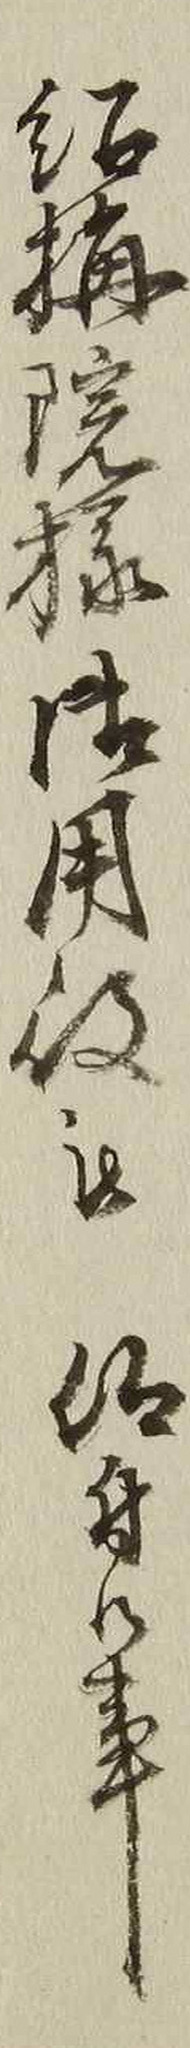紹栴院様御用役被仰付候事
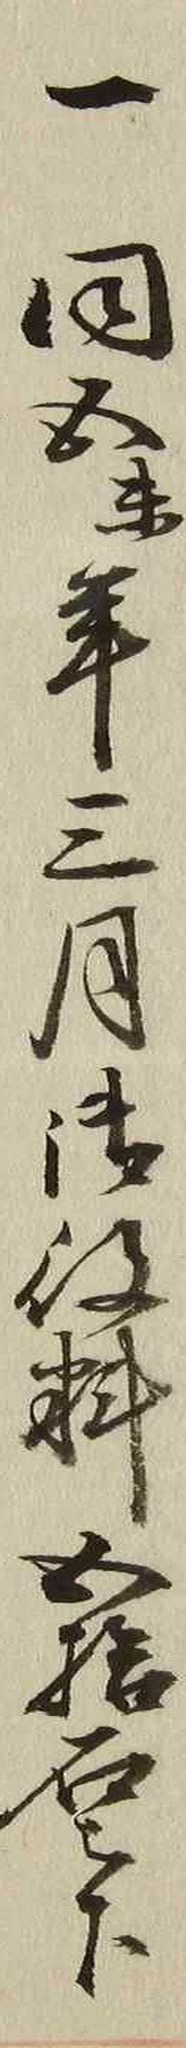一同五未年三月御役料五拾石被下
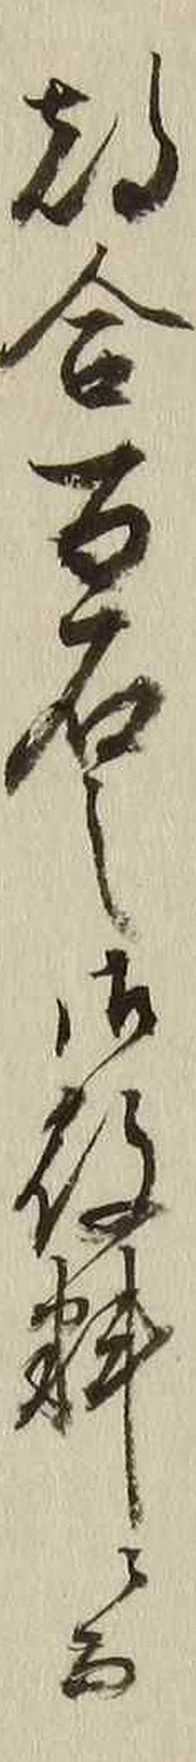都合百石之御役料ニ而
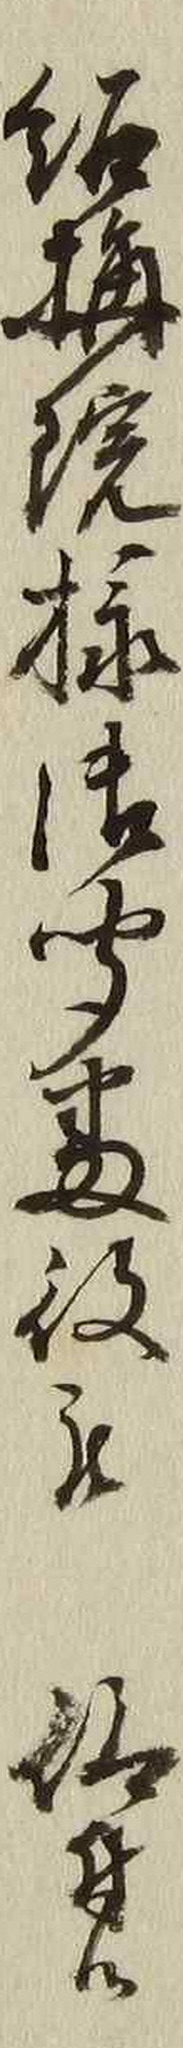紹栴院様御聞番役被仰付候
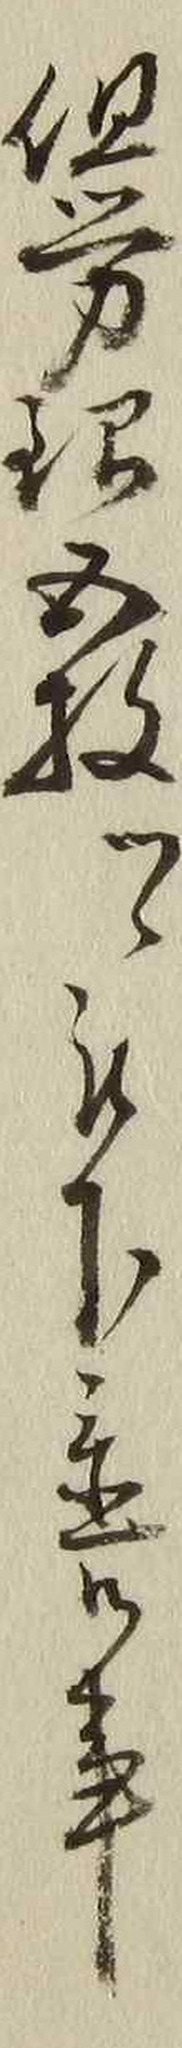但労銀五枚ツヽ被下置候事
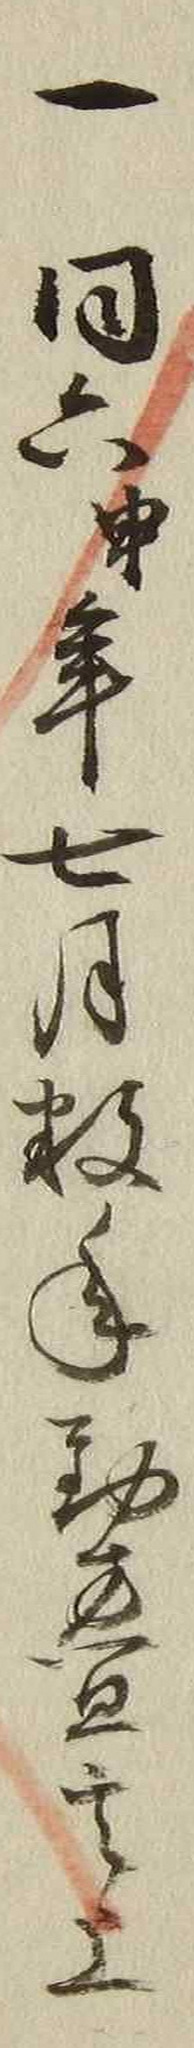一同六申年七月数年勤方宜其上
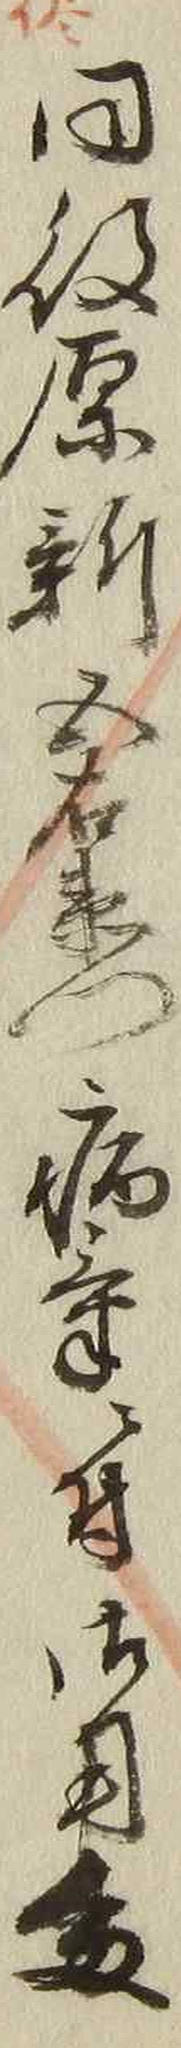同役原新五右衛門病気ニ付御用多
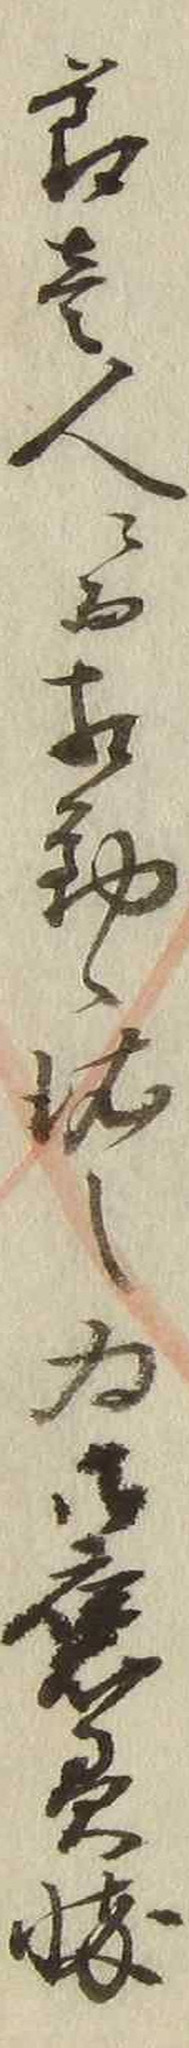節壱人ニ而相勤候依之為御褒美悴
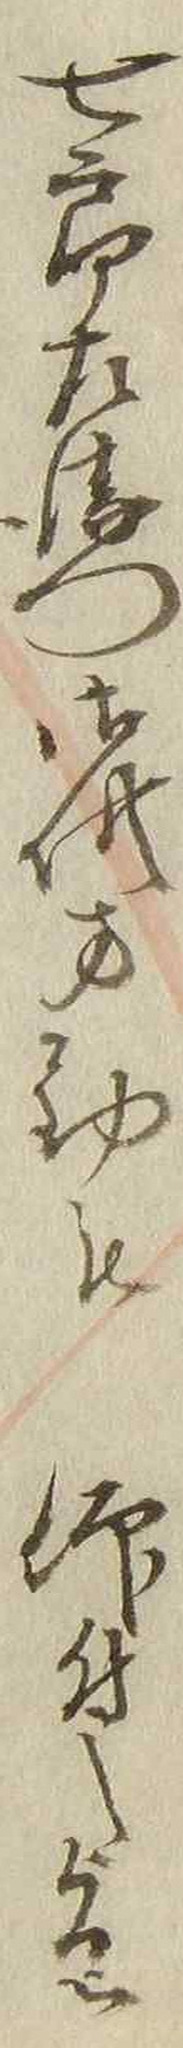七郎左衛門御供方勤被仰付之旨被
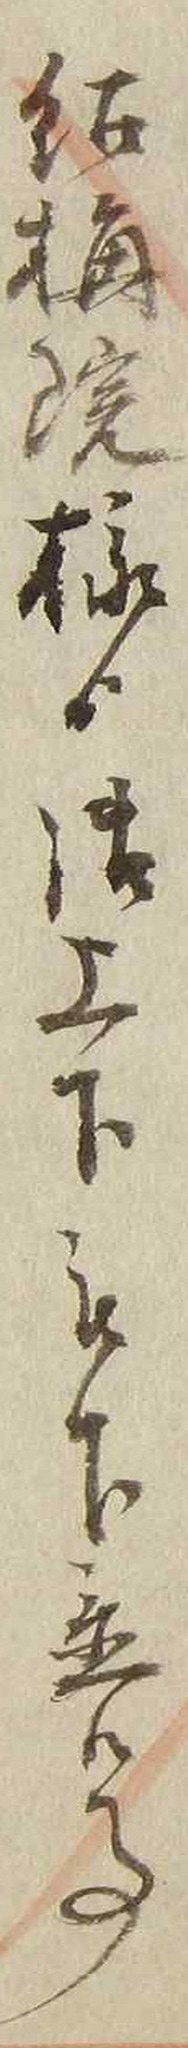紹栴院様ゟ御上下被下置候事

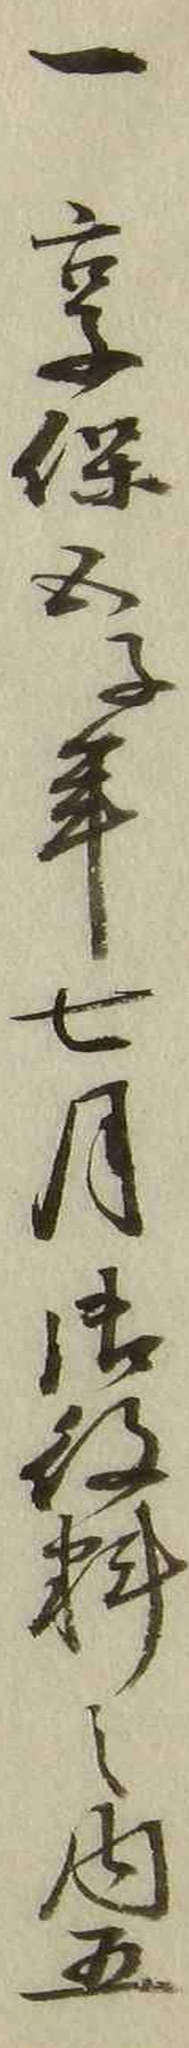一享保五子年七月御役料之内五
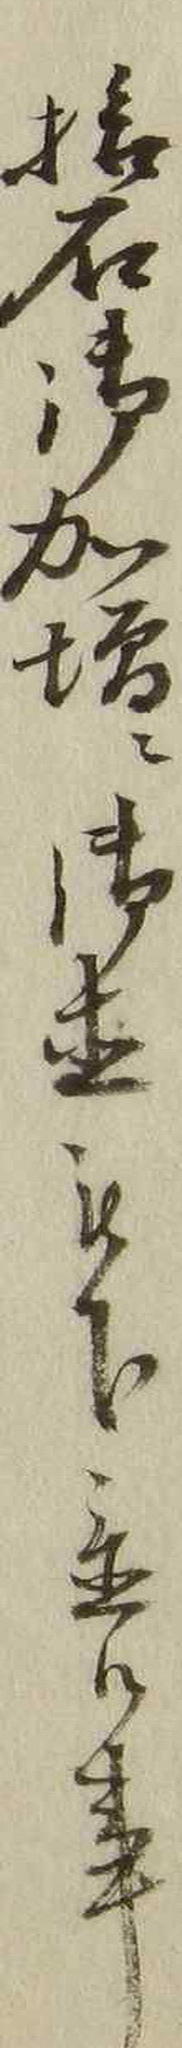拾石御加増ニ御直被下置候事
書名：諸士系譜　巻之23　い之部23
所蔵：会津若松市立会津図書館
